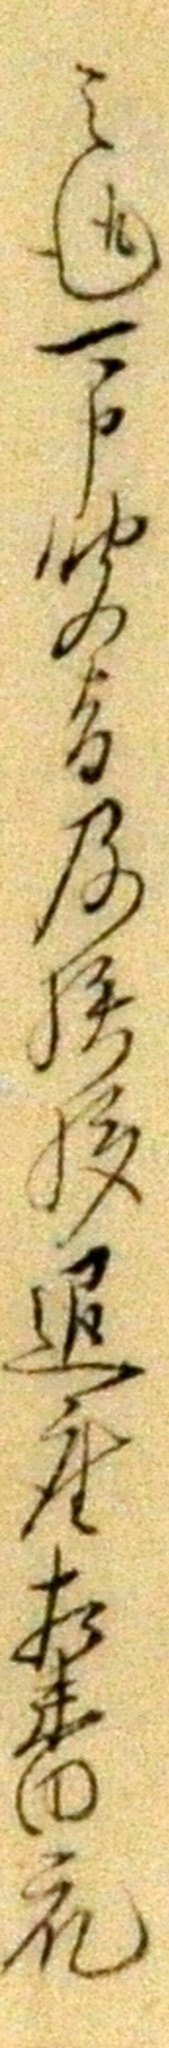之趣可申聞旨及挨拶退座相番衆
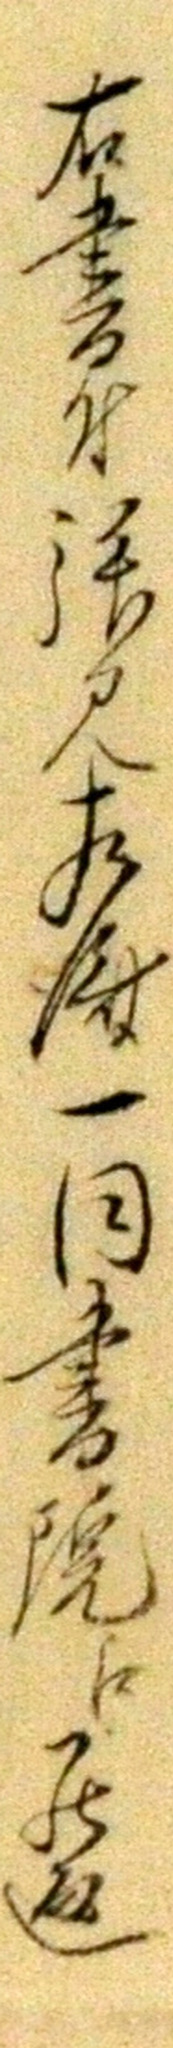右書付拝見相済一同書院え罷通
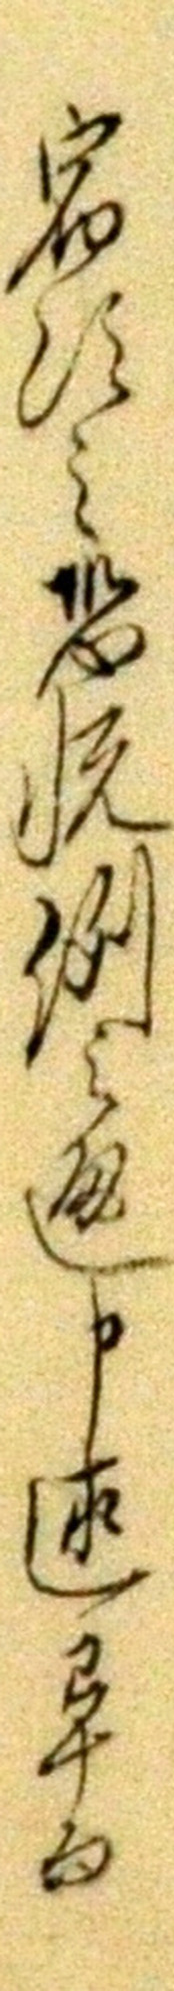宿次之恐悦例之通申述畢而
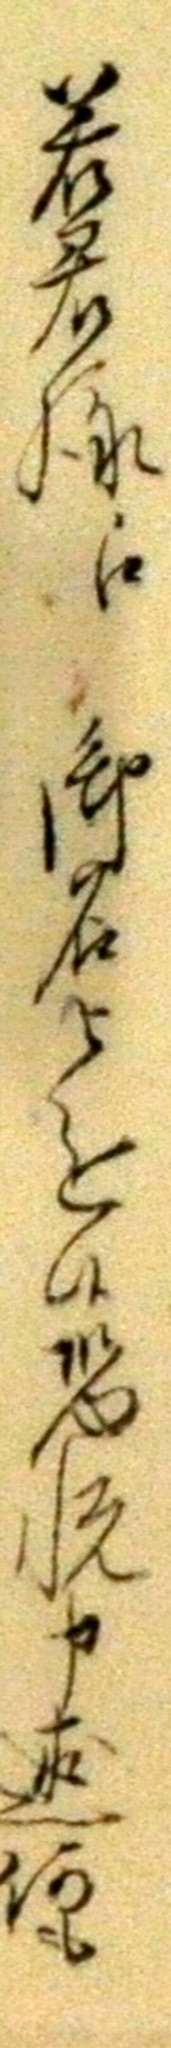若君様え御名被進候恐悦申述何も
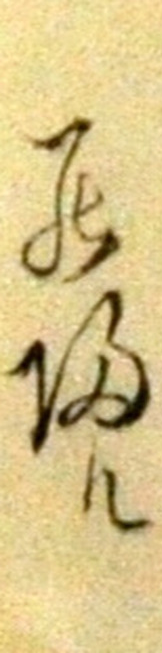罷帰ル

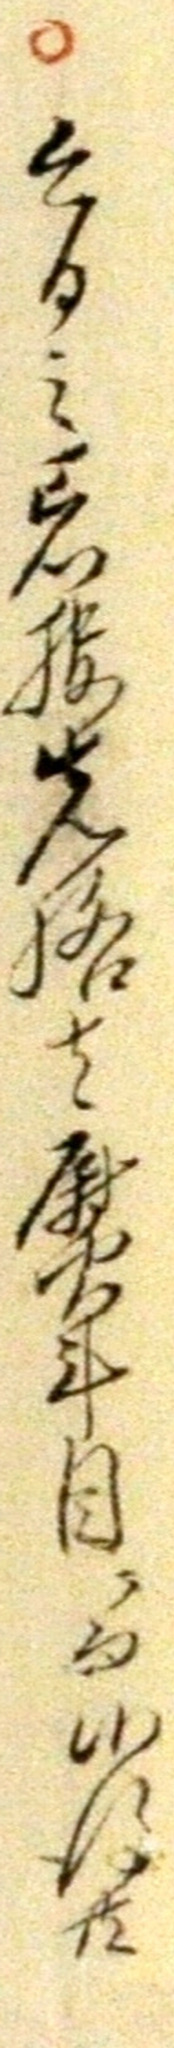今日之着服先格は熨斗目二而候得共
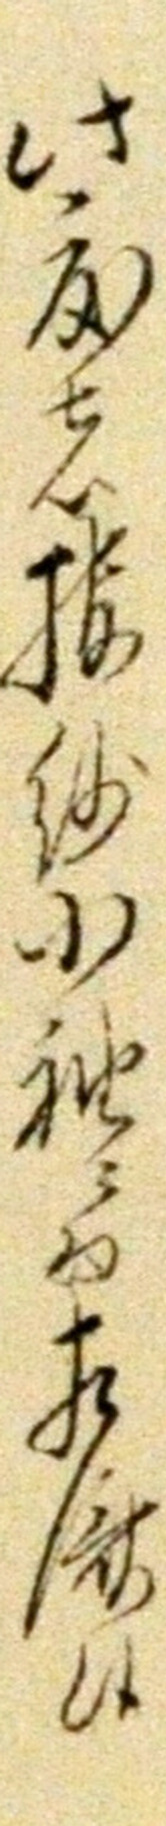此度は服紗小袖二而相済候
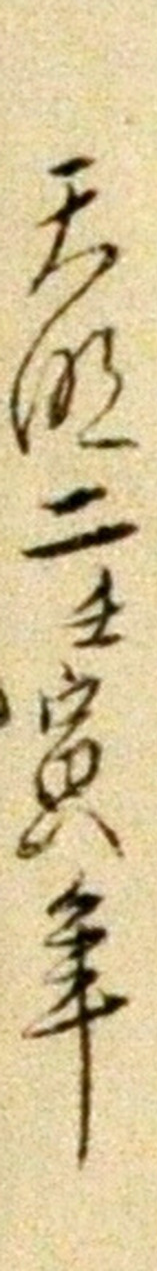天明ニ壬寅年
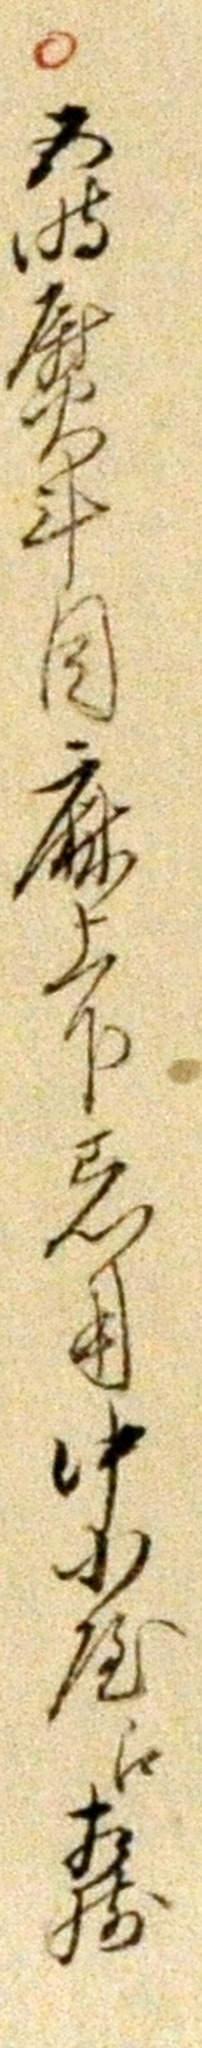五時熨斗目麻上下着用中小屋え相揃
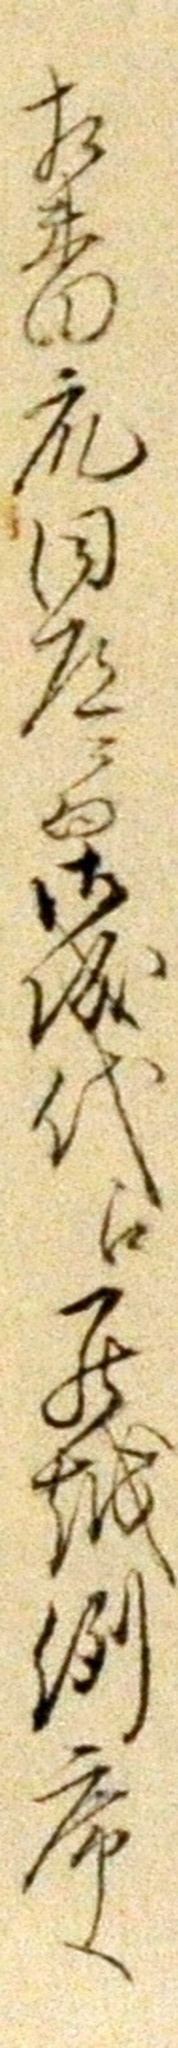相番衆同道ニ而御城代え罷越例席へ
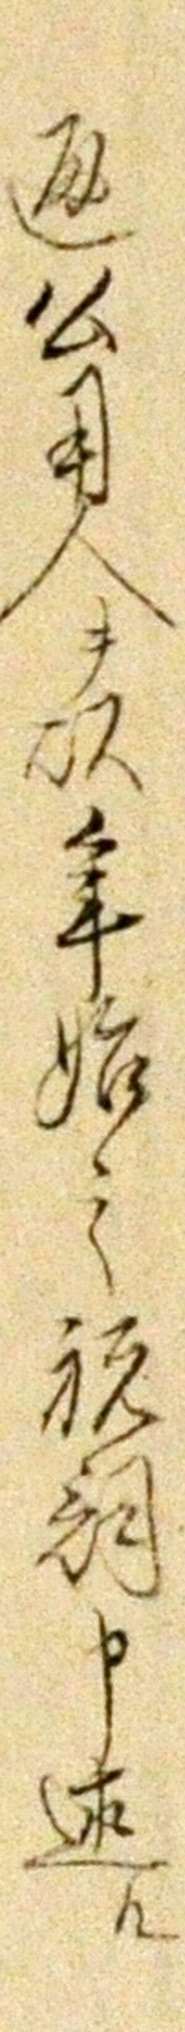通公用人ヲ以年始之祝詞申述ル
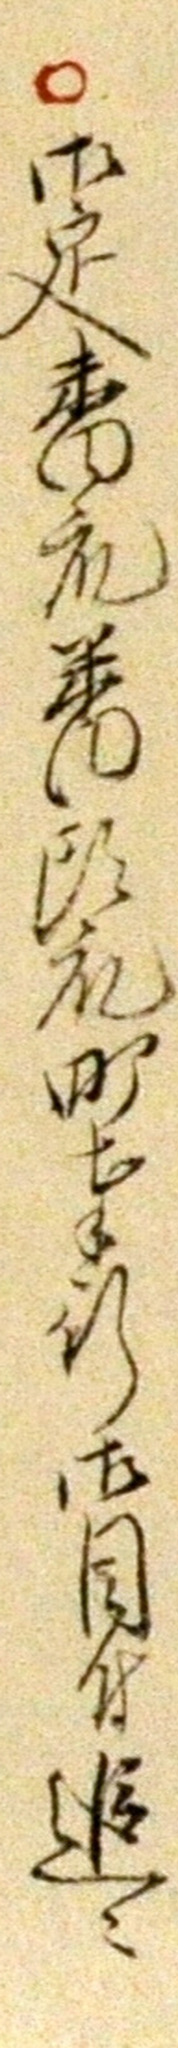御定番衆番頭衆町奉行御目付追々
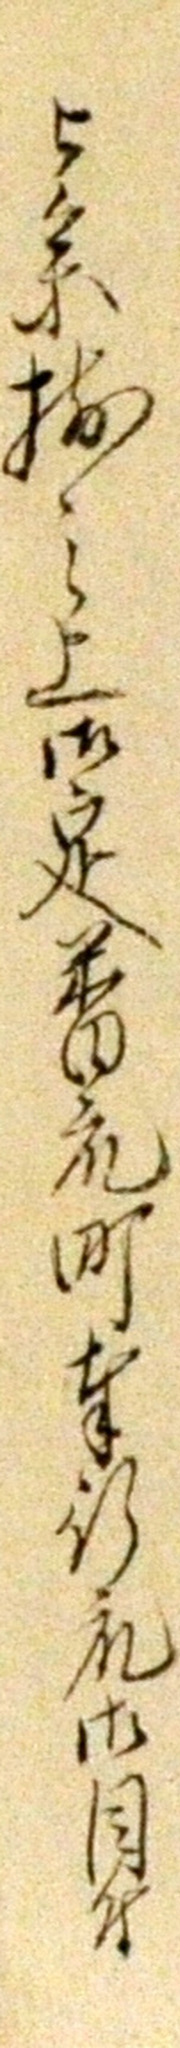被参揃之上御定番衆町奉行衆御目付
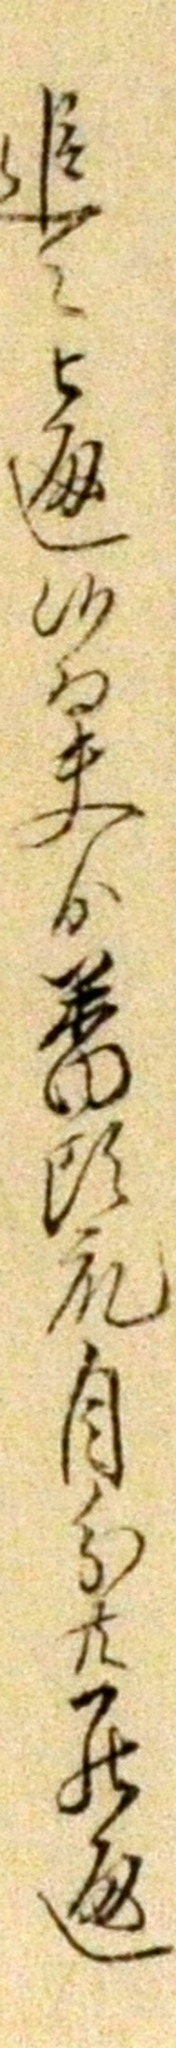追々被通候而夫ゟ番頭衆自分共罷通
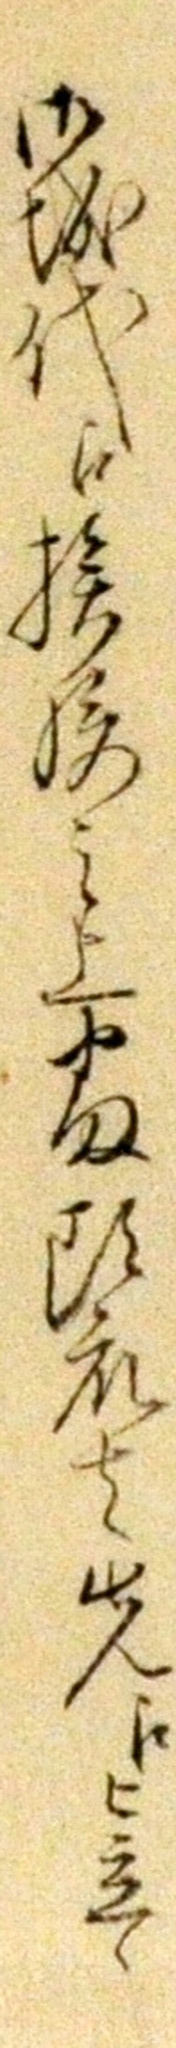御城代え挨拶之上番頭衆は先え被立候
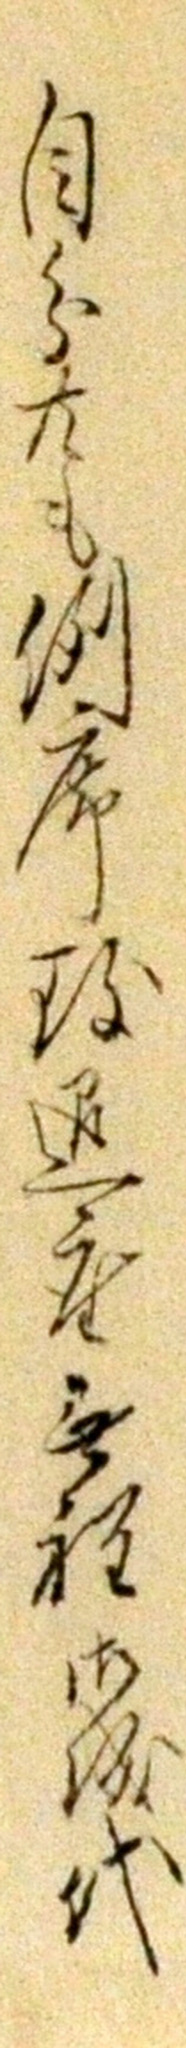自分共も例席致退座無程御城代
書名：大阪加番関係諸書留〔一括〕
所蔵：伊那市立高遠町図書館・合同会社AMANE
